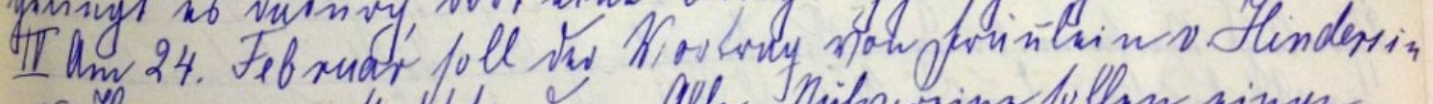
IV Am 24. Februar soll der Vortrag von Fräulein v. Hindersen
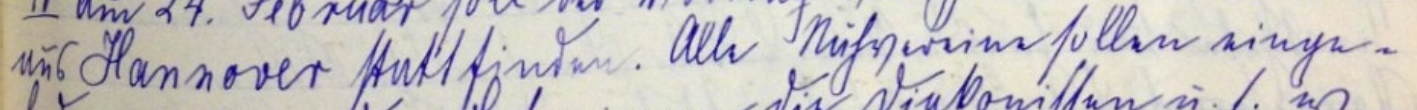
aus Hannover stattfinden. Alle Nähvereine sollen einge
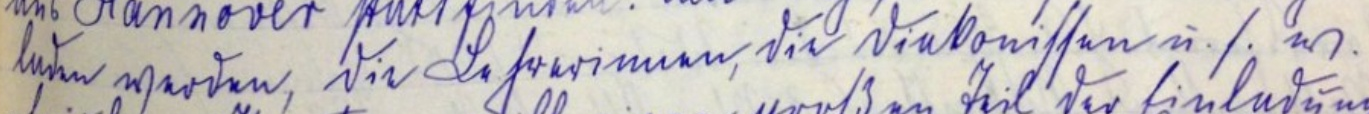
laden werden, die Lehrerinnen, die Diakonissen u.s.w.
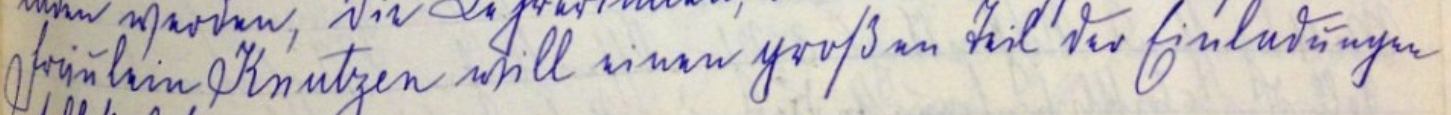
Fräulein Knutzen will einen großen Teil der Einladungen
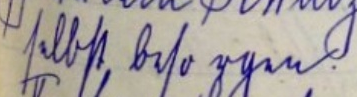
selbst besorgen.
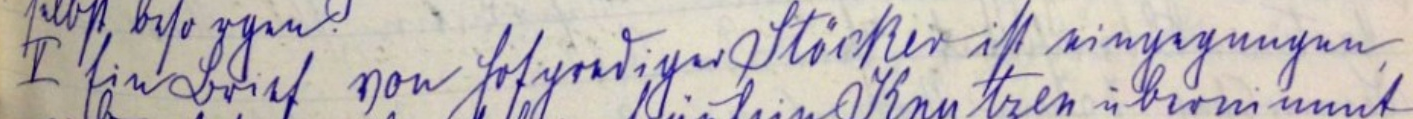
V Ein Brief von Hofprediger Stöcker ist eingegangen
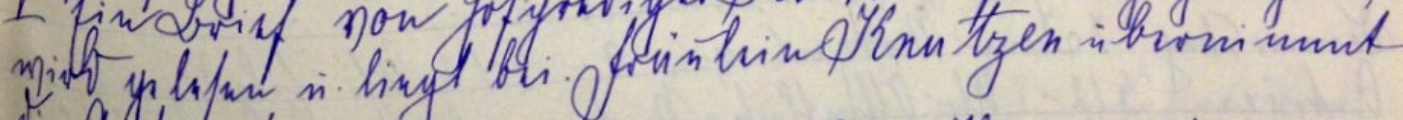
wird gelesen und liegt bei. Fräulein Knutzen übernimmt
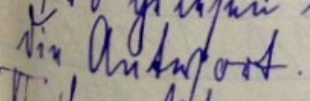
die Antwort.
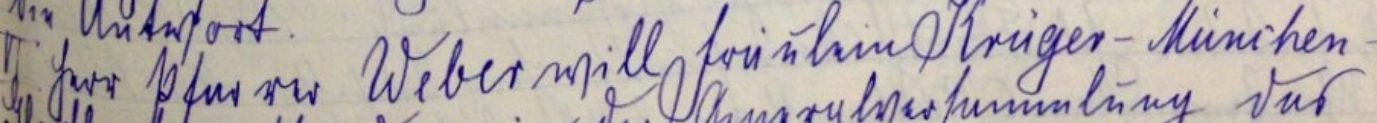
VI Herr Pfarrer Weber will Fräulein Krüger - München-
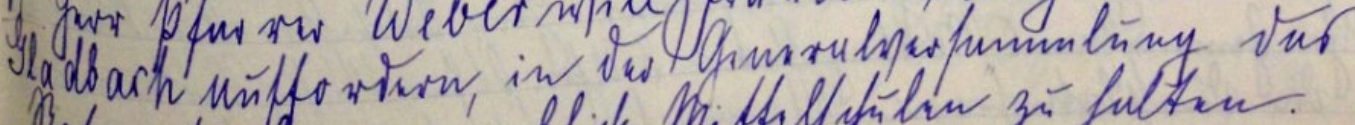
Gladbach auffordern in der Generalversammlung das
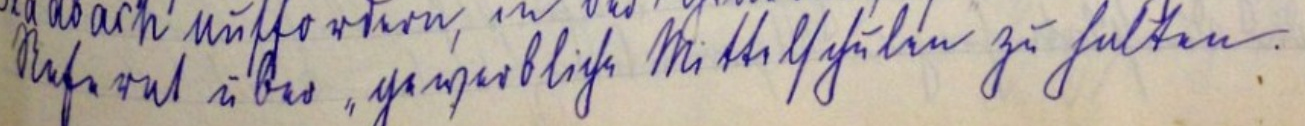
Referat über „gewerbliche Mittelschulen" zu halten.
